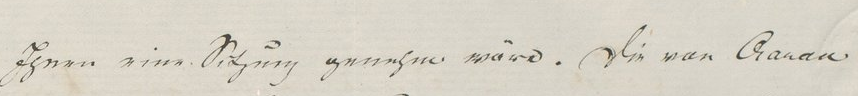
Ihnen eine Sitzung genehm wäre. Die von Aarau
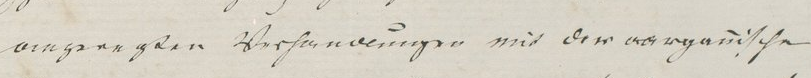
angeregten Verhandlungen mit der aargauischen
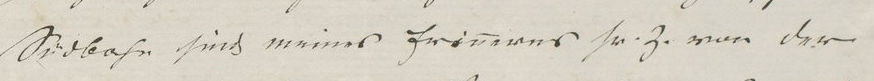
Südbahn sind meines Erinnerns sr. Z. von der
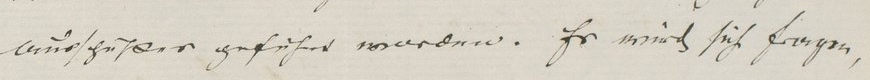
ausschußes geführt worden. Es wird sich fragen,
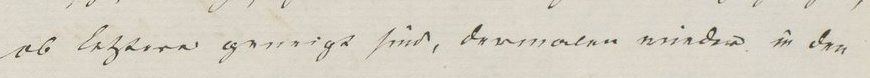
ob letztere geneigt sind, dermalen wieder in den
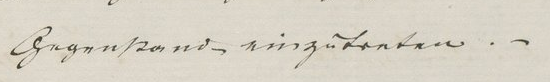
Gegenstand einzutreten. –
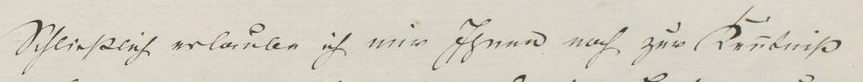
Schließlich erlaube ich mir Ihnen noch zur Kenntniß
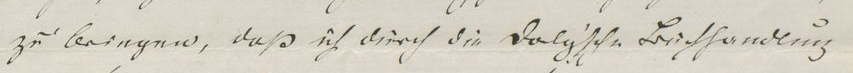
zu bringen, daß ich durch die Dalp'sche Buchhandlung
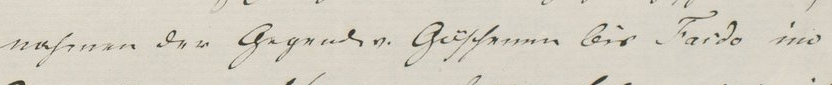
nahmen der Gegend v. Göschenen bis Faido im
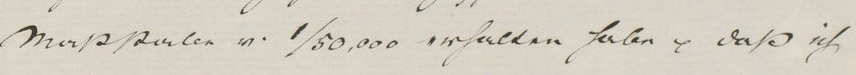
Maßstabe v. 1/50,000 erhalten habe & daß ich
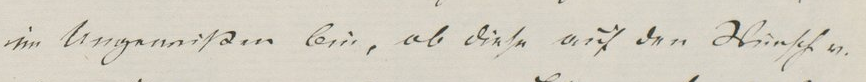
im Ungewißen bin, ob diese auf den Wunsch v.
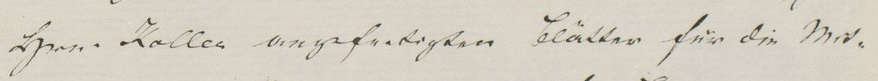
Hrn. Koller angefertigten Blätter für die Mit-
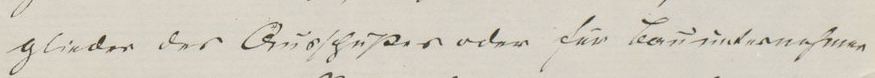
glieder des Ausschußes oder für Bauunternehmen
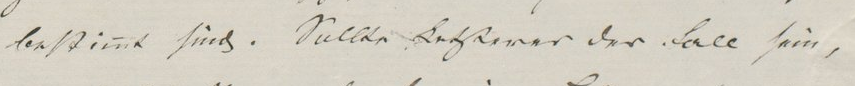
bestimmt sind. Sollte Letzteres der Fall sein,
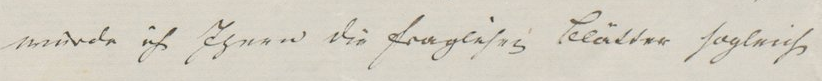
würde ich Ihnen die fraglichen Blätter sogleich
